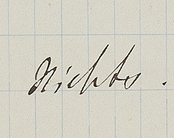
nichts.
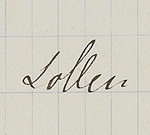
sollen
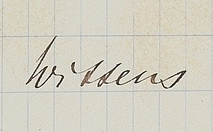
Sie unterrichtet
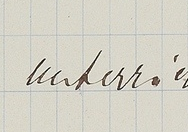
bleiben.
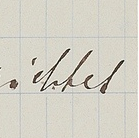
Welti
